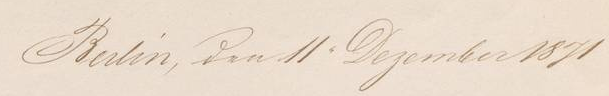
Berlin, den 11 Dezember 1871
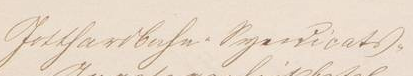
Gotthardbahn-Syndicats-
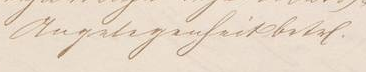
Angelegenheit betr.
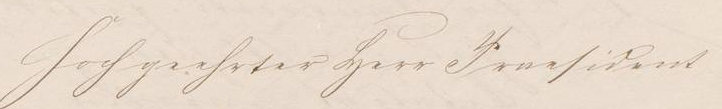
Hochgeehrter Herr Praesident
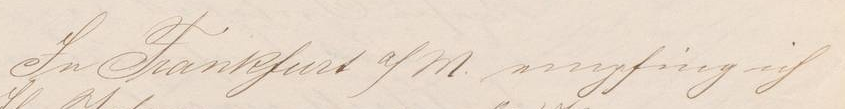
In Frankfurt a. M. empfing ich
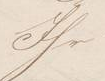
Ihr
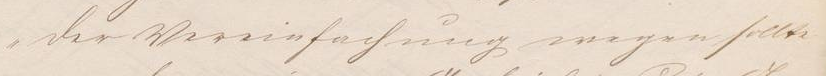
«Der Vereinfachung wegen sollte
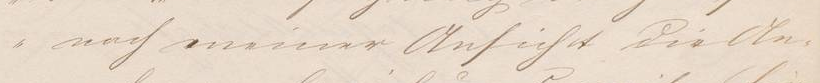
nach meiner Ansicht die An-
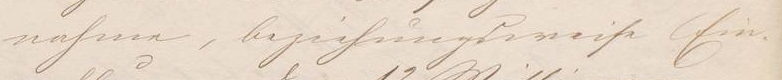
nahme, beziehungsweise Ein-
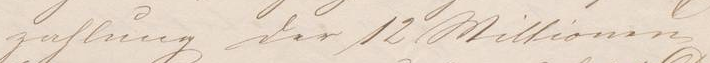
zahlung der 12 Millionen
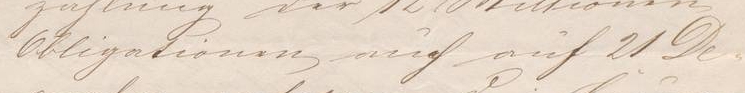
Obligationen auch auf 21 De-
